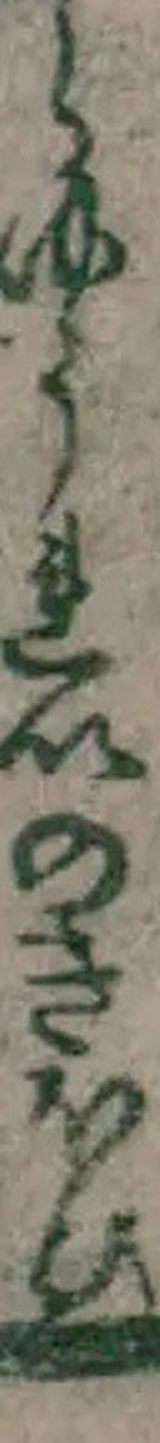からゆうれいのきほひ
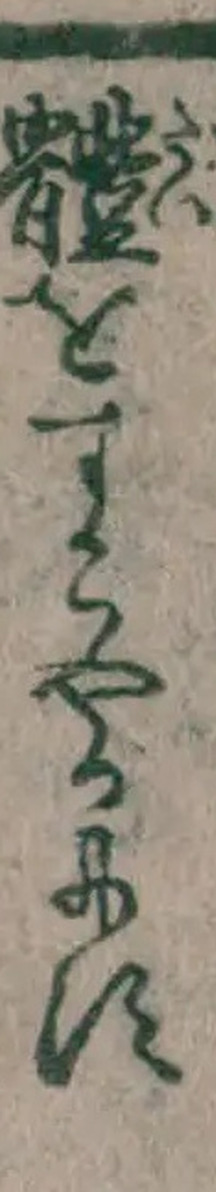體をすこやかにす
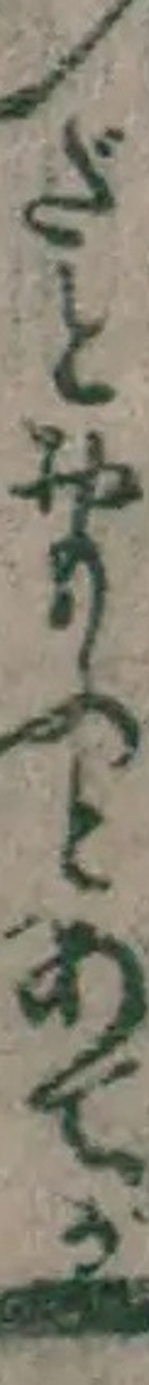だとおもふとあてが
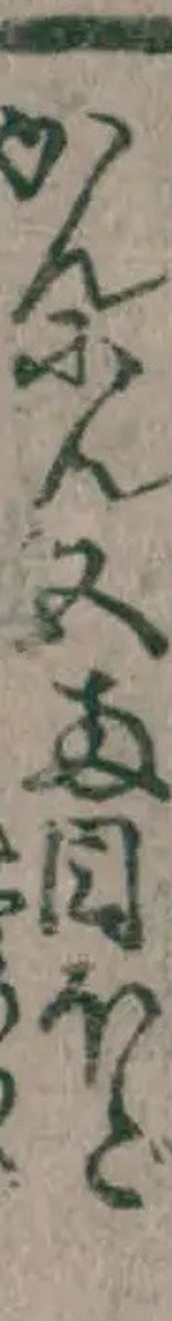かんにん五両目ほど
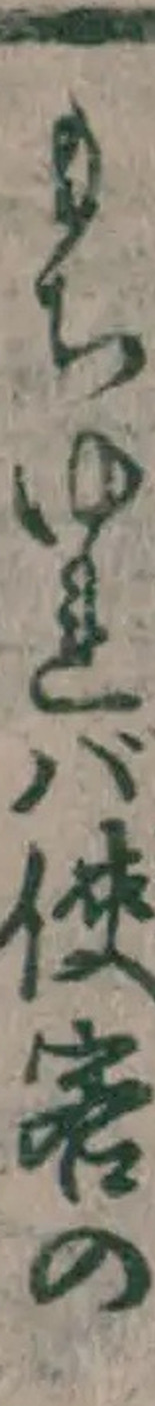もちゆれば俠客の
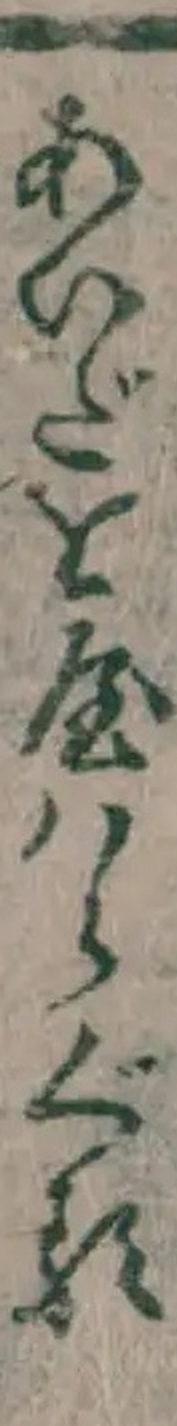あいだをやはらぐる
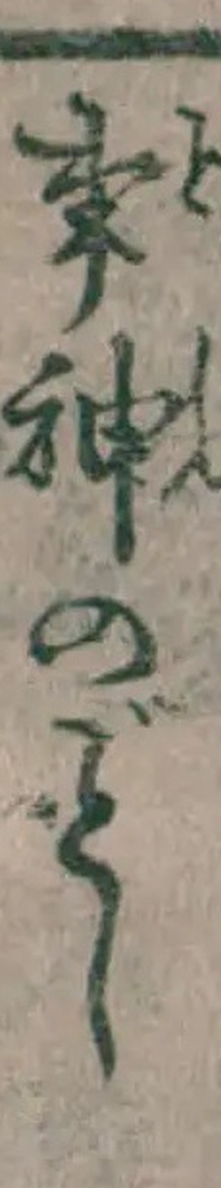事神のごとし
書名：視薬霞報条 3巻
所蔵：国立国会図書館 National Diet Library, JAPAN
